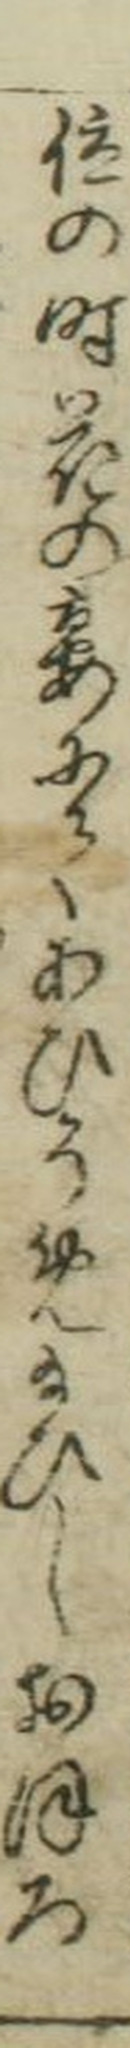位の時花の宴にてあひそめ給ひしおほろ
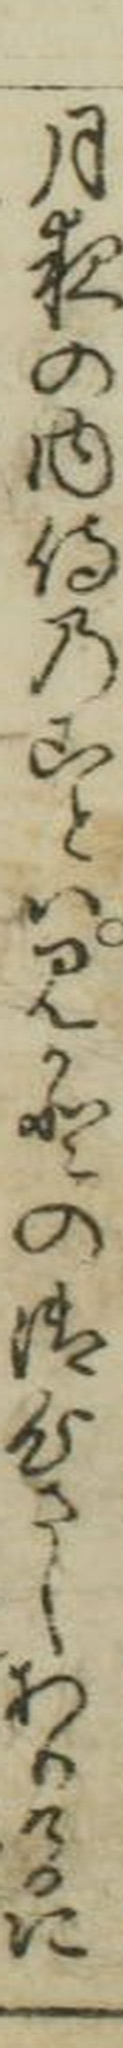月夜の内侍のことは。みかとの御心さしありけるに
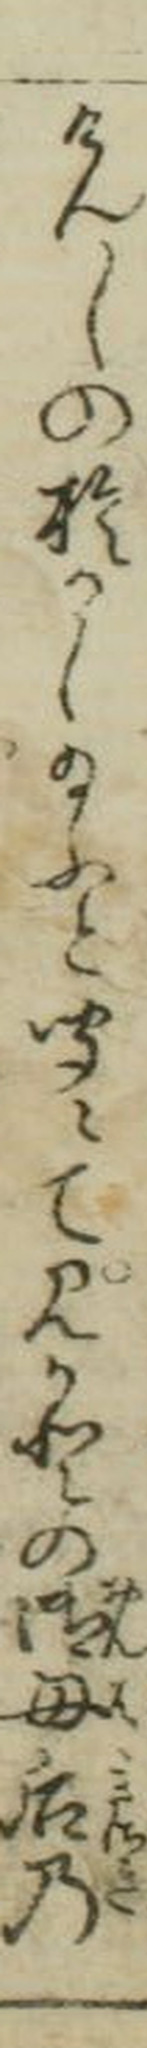けんしのおはし給ふと聞えて。みかとの御母后の
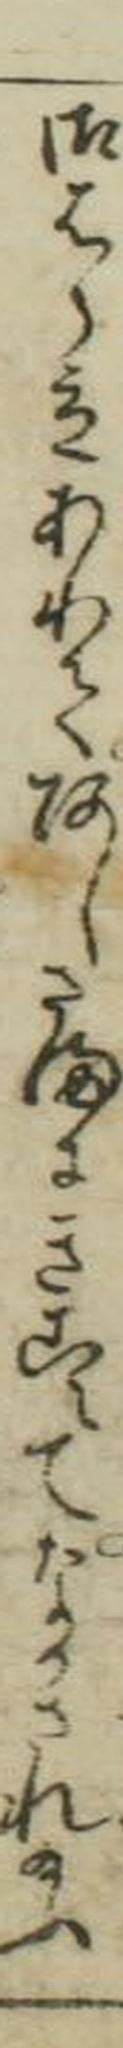御はゝ立ありて。あしさまにきこえて。なかされ給ふ
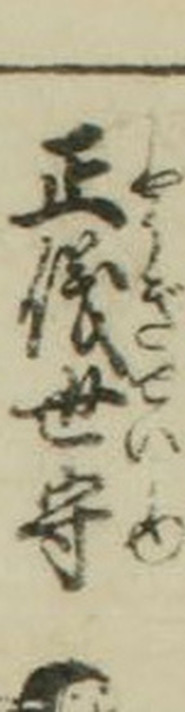正儀世守
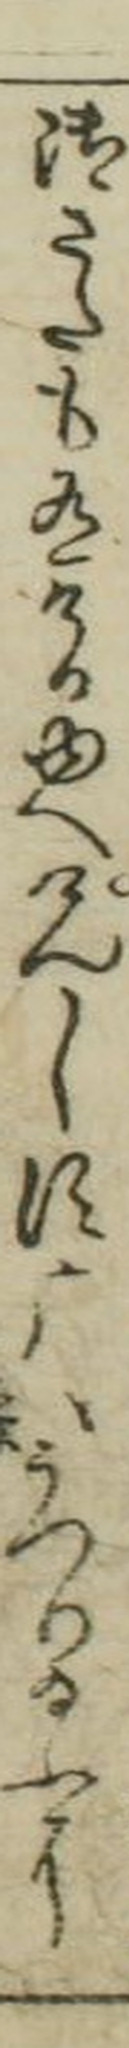御さたも有けるゆへ。けんし須磨へうつり給ふに
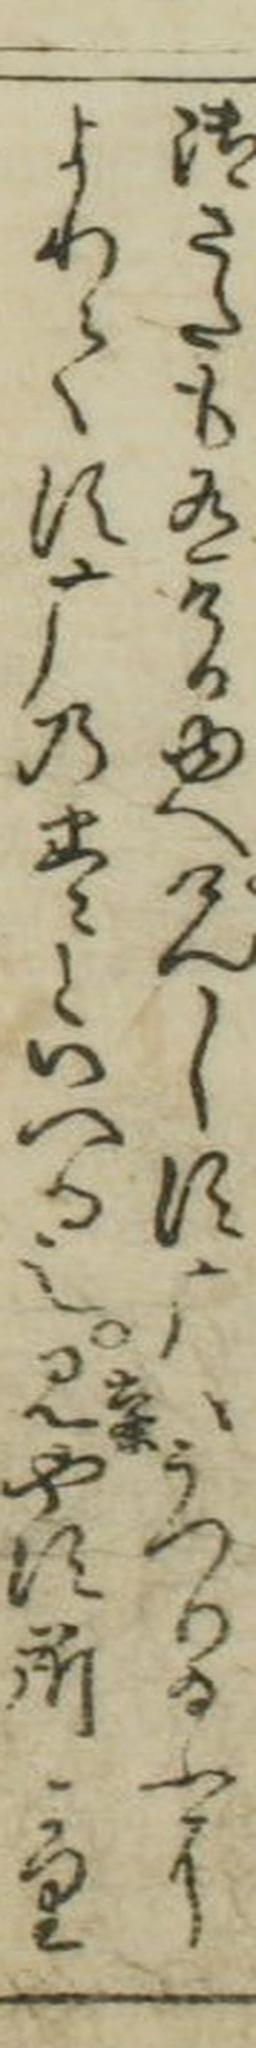よりて須磨の巻といへる也。みやす所より
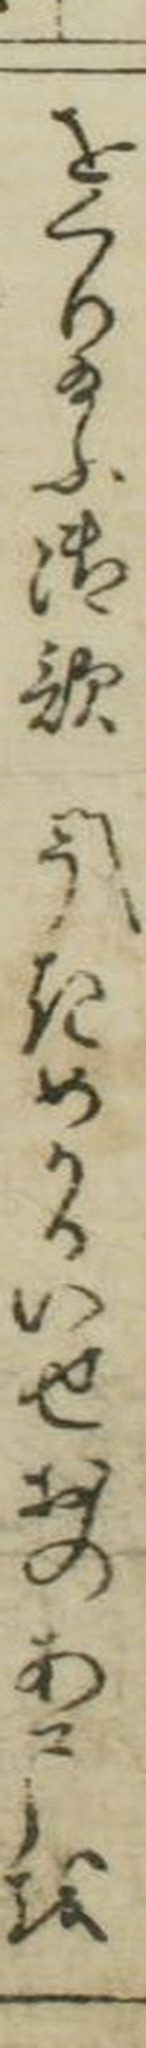をくり給ふ御歌〽うきめかるいせおのあまを
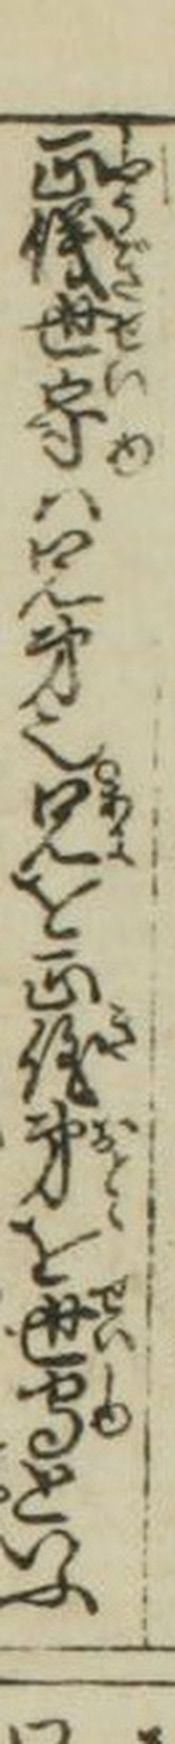正儀世守は兄弟也。兄を正儀弟を世守といふ
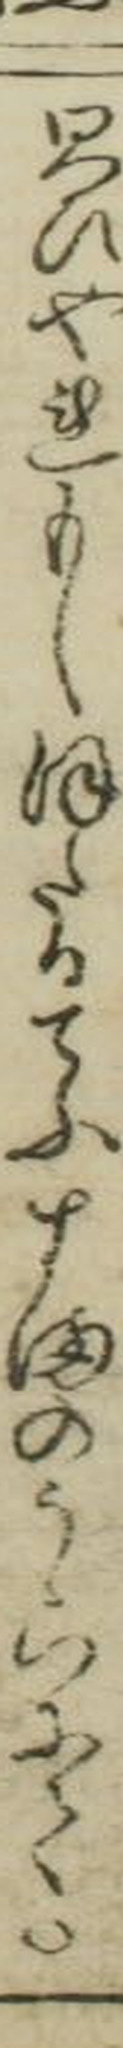思ひやれもしほたるてふすまのうらにて○
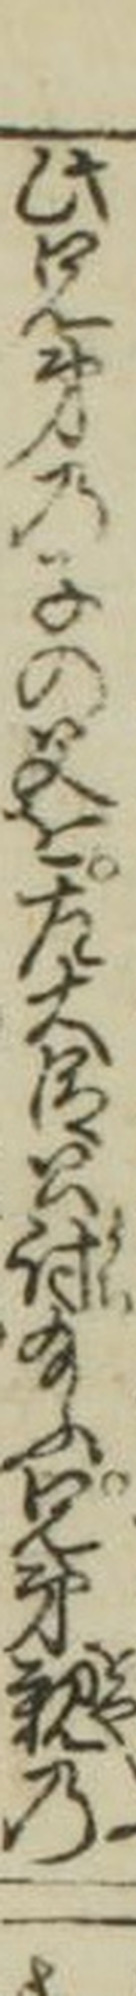此兄弟の子の父を。左大臣公討給ふ。兄弟親の
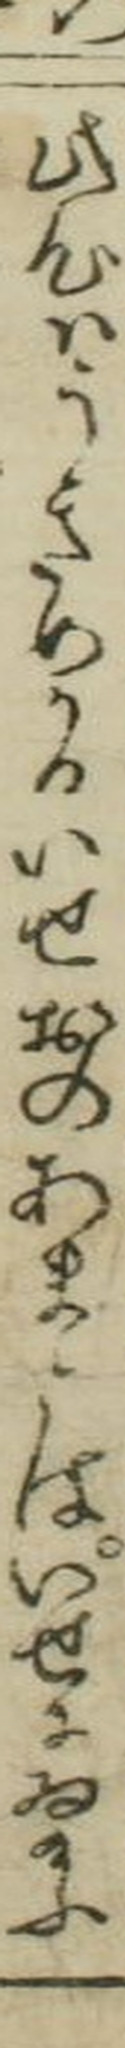此心はうきめかるいせおのあまとは。いせにゐ給ふ
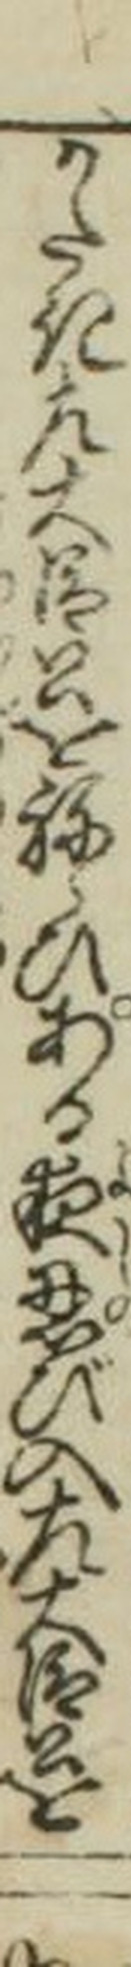かたき左大臣公をねらひ。ある夜忍び入左大臣公を
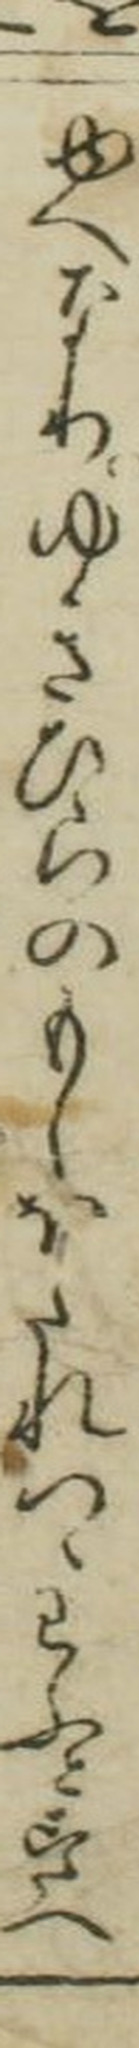ゆへなり。ゆきひらのもしほたれつゝわふとこたへ
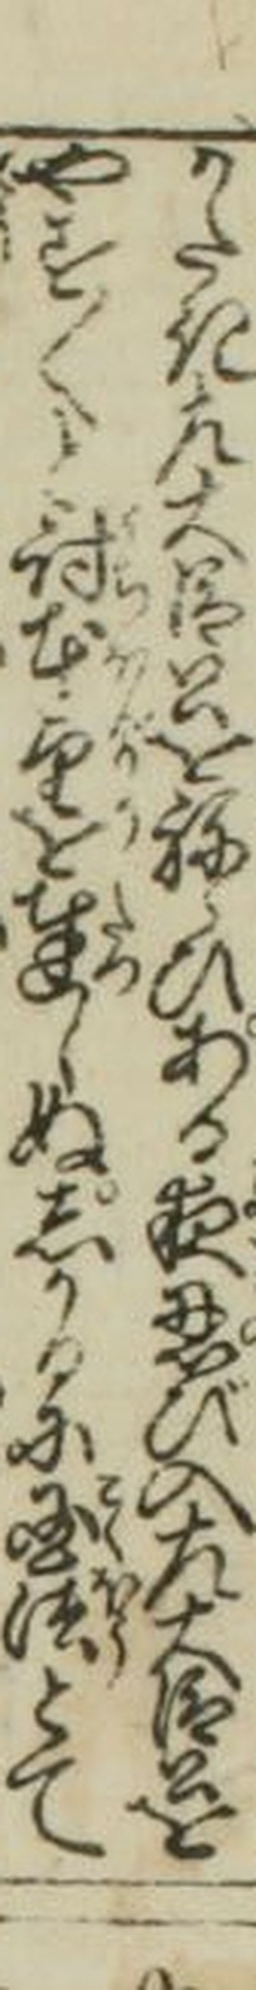やす〳〵と討本望を達しぬ。しかるに国法とて
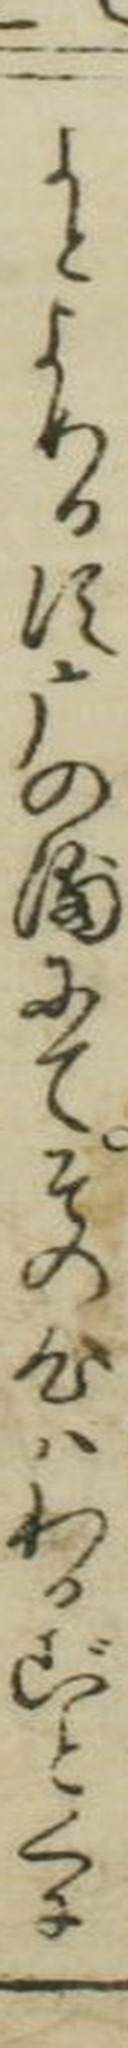よとよめる須磨の浦にて。その心はわかごとくに
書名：女源氏教訓鑑
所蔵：東京学芸大学附属図書館
